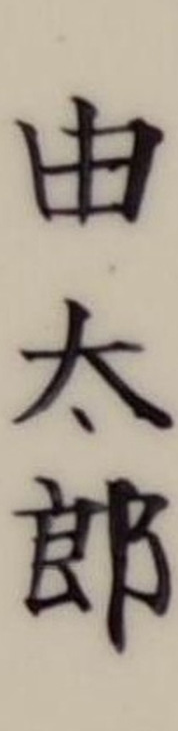由太郎
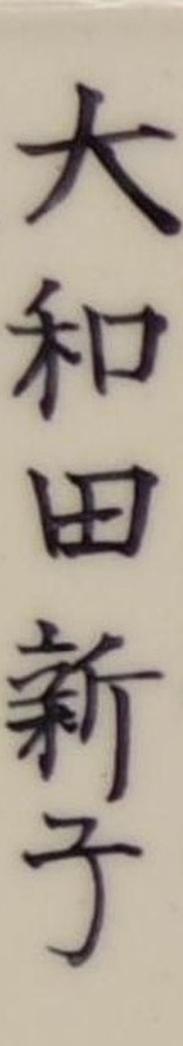大和田新子
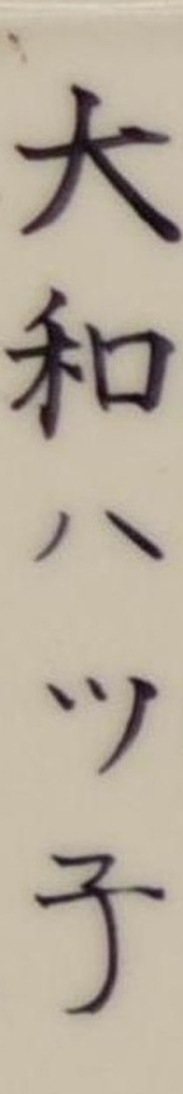大和ハツ子
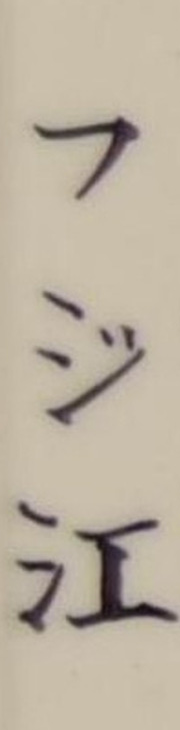フジ江

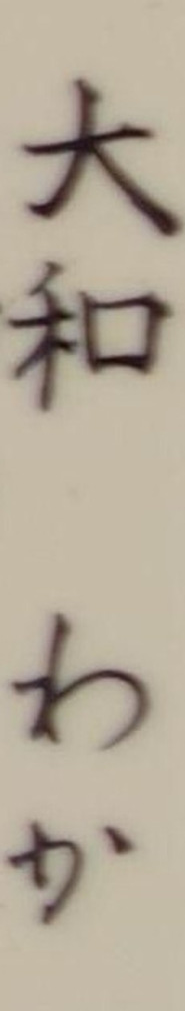大和わか
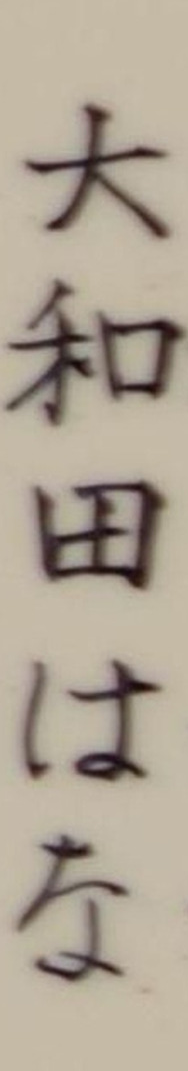大和田はな
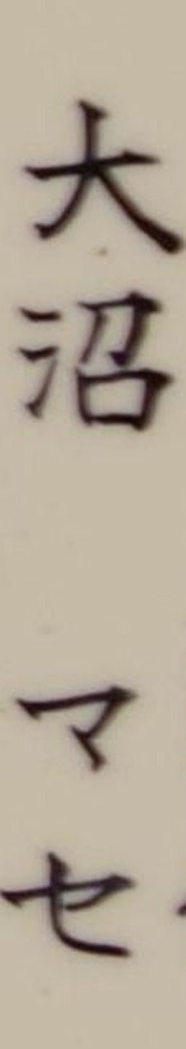大沼マセ
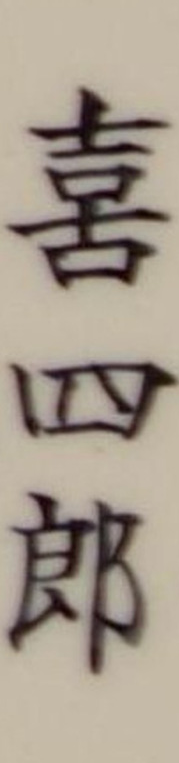喜四郎
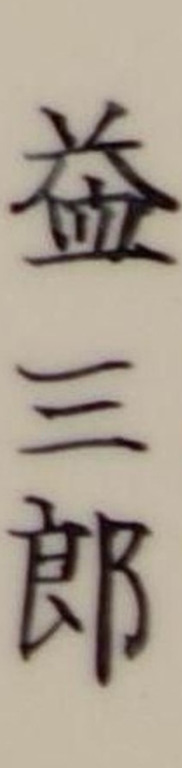益三郎
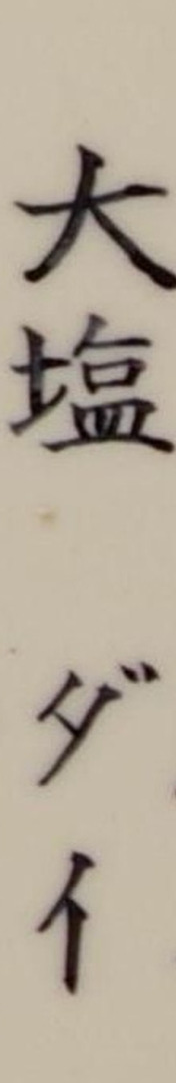大塩ダイ
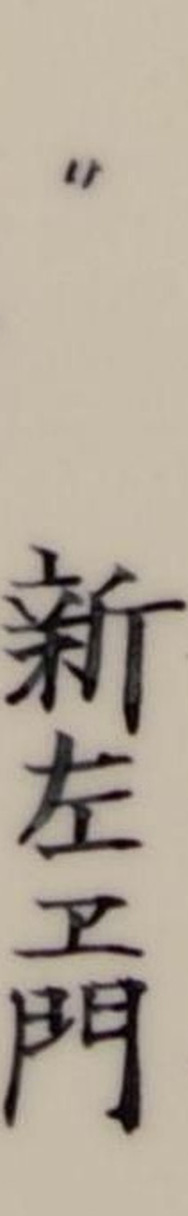新左ヱ門
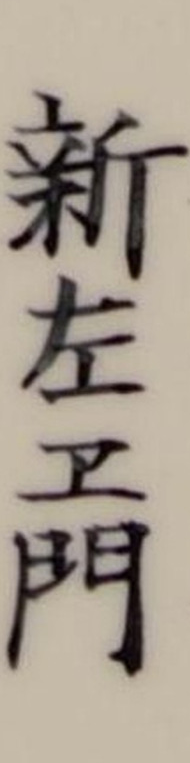新左ヱ門
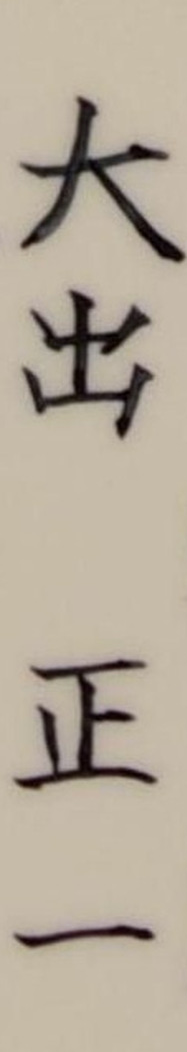大出正一
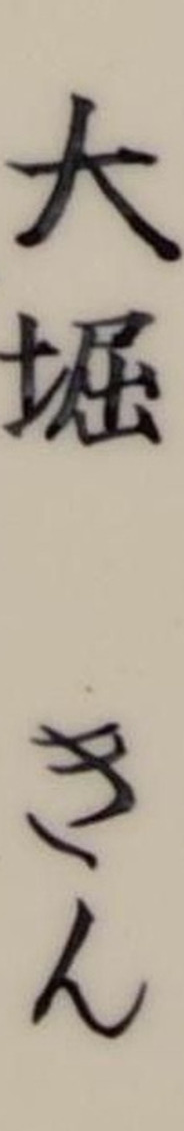大堀きん
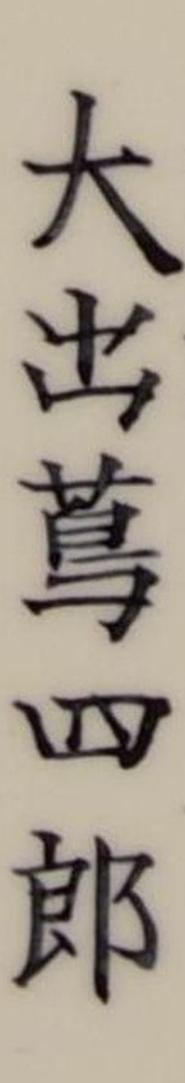大出蔦四郎
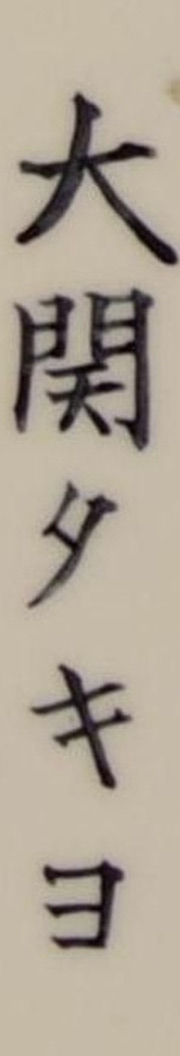大関タキヨ
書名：M~S
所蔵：高野山金剛峯寺
